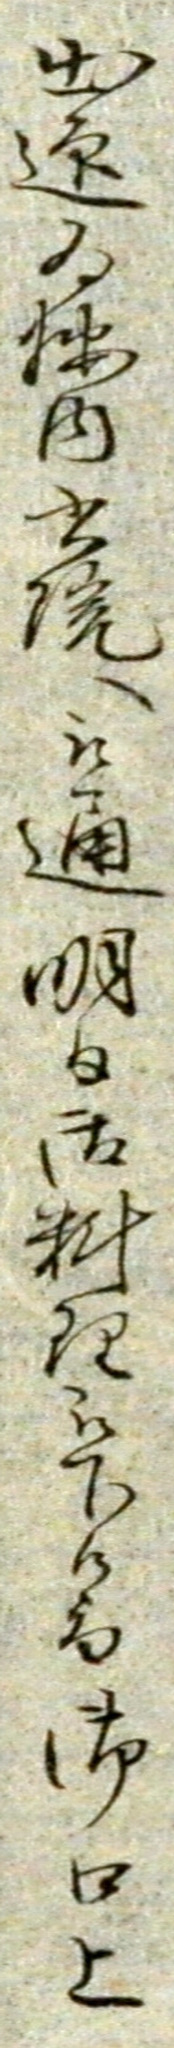出迎為按内書院へ被通明日御料理被下候旨御口上
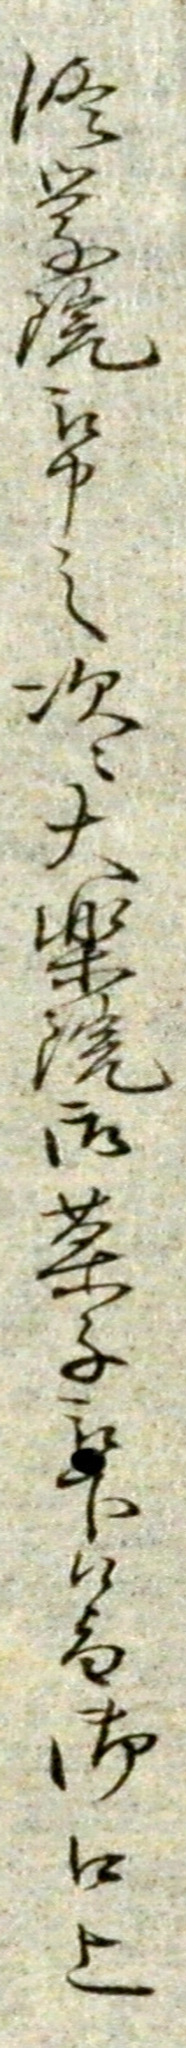修学院被申之次ニ大楽院御菓子被下候旨御口上
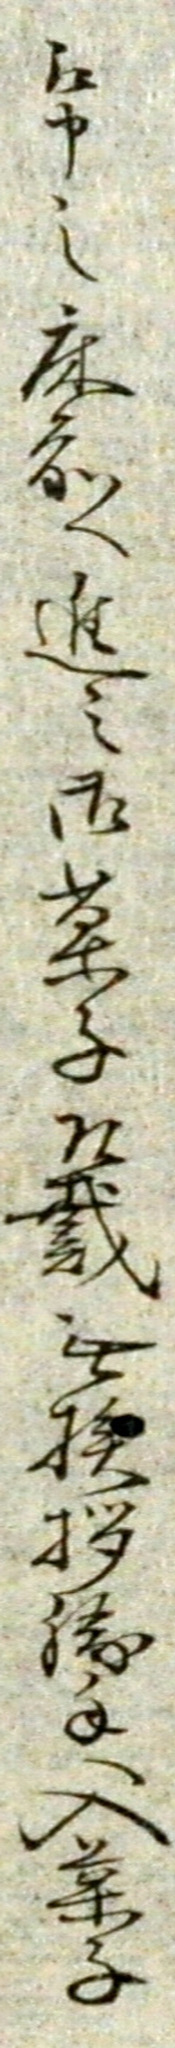被申之床前へ進ミ御菓子頂戴無挨拶勝手へ入菓子
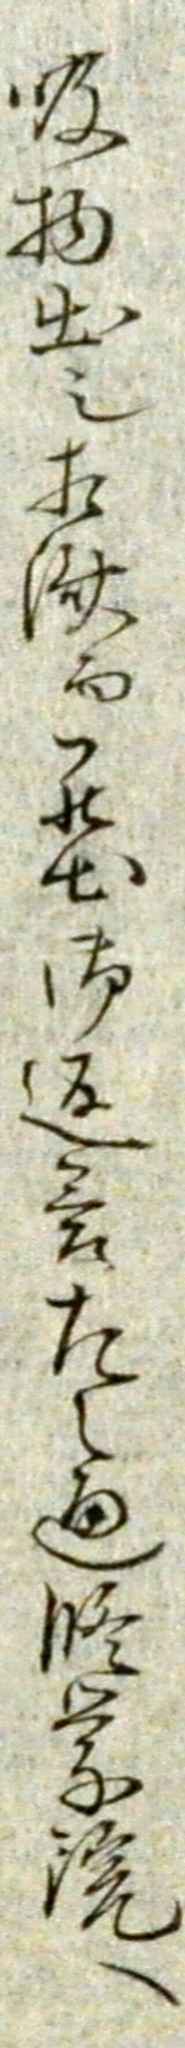吸物出シ相済而罷出御返答左之通修学院へ
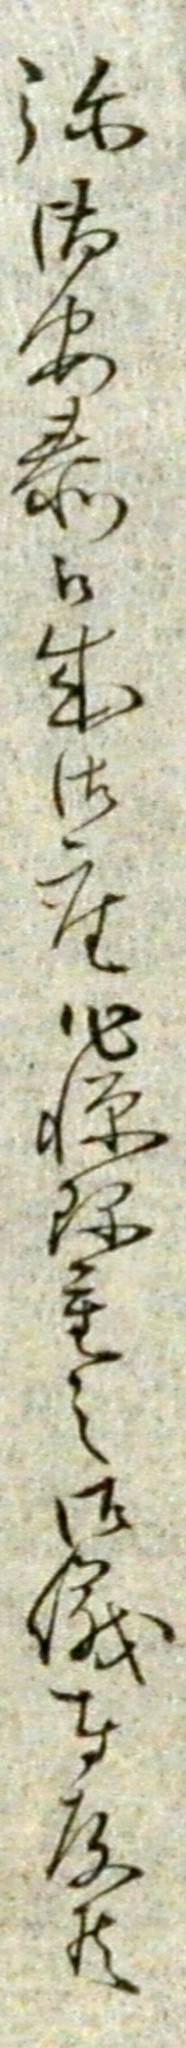弥御安泰被成御座乍憚珍重之御儀奉存候
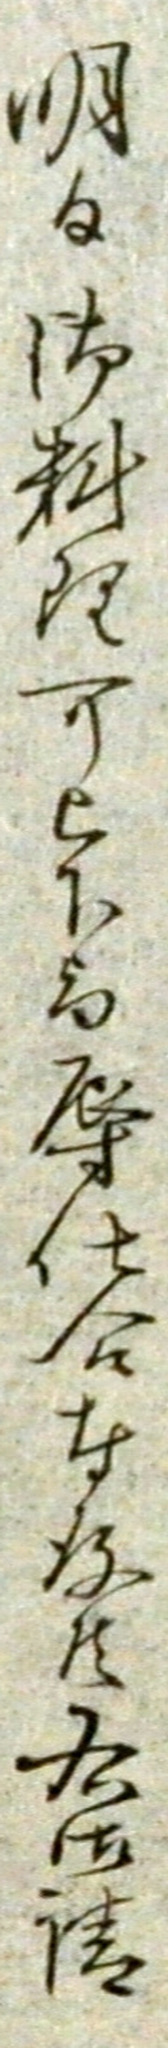明日御料可被下旨辱仕合奉存候右御請
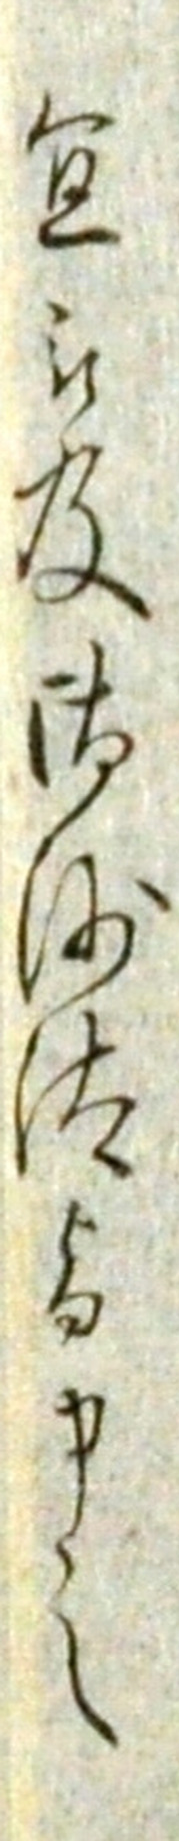宜被及御沙汰旨申之

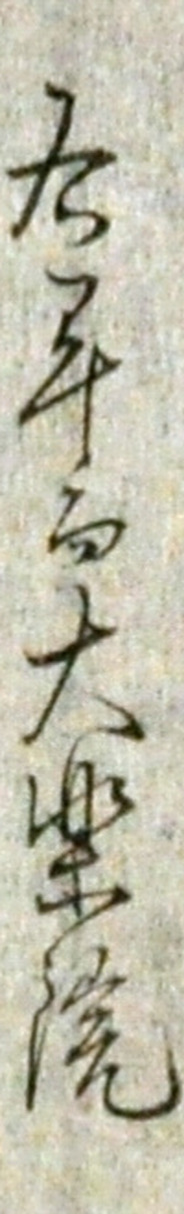右畢而大楽院
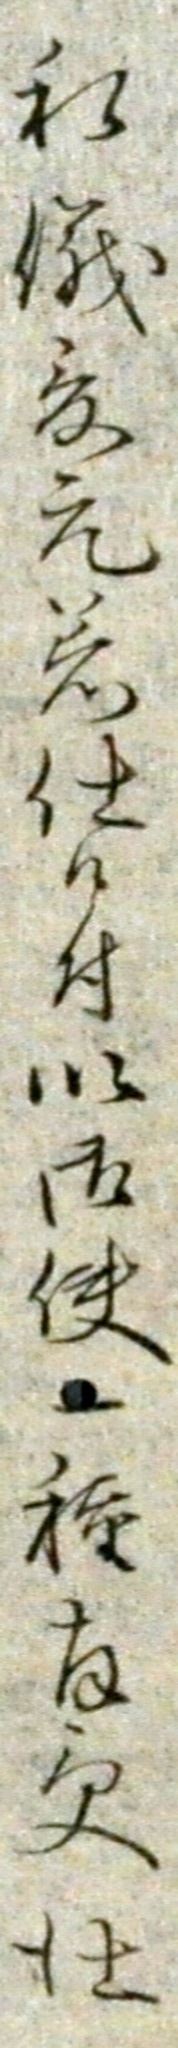私儀爰元着仕候付以御使一種拝受仕
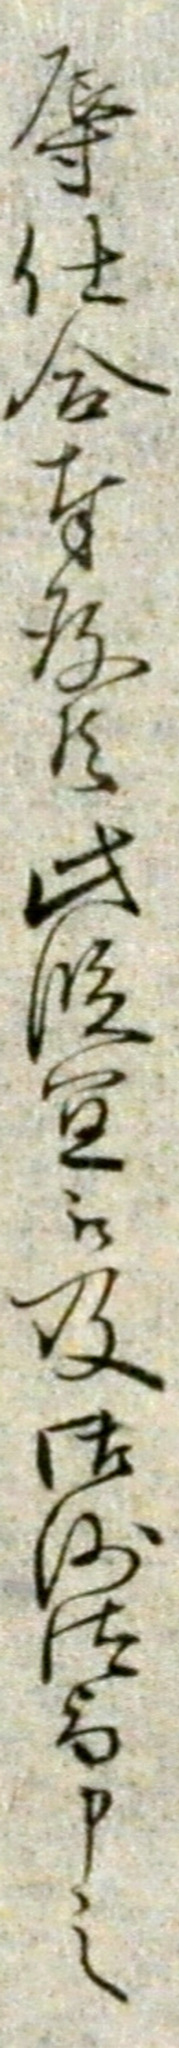辱仕合奉存候此段宜被及御沙汰旨申之
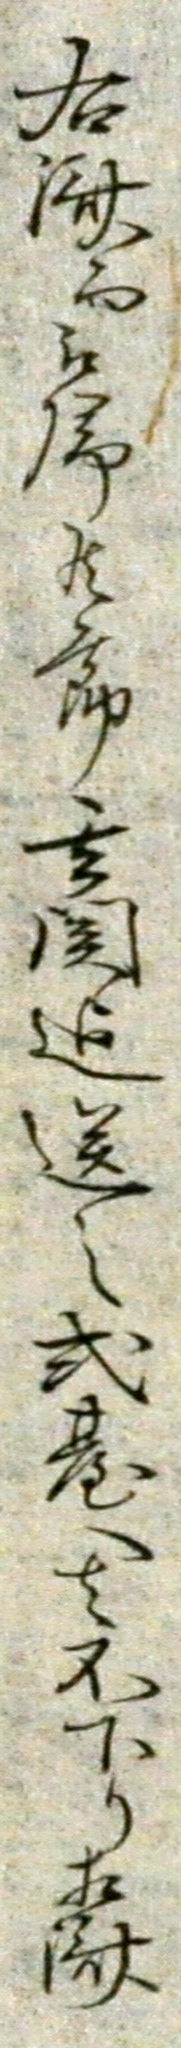右済而被帰候節玄関迠送之式臺へは不下り相済
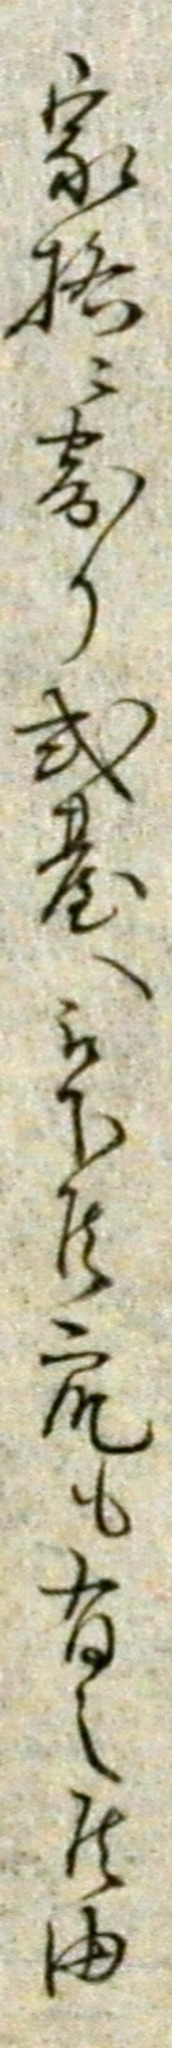家格ニ寄リ式臺へ被下候衆も有之候由
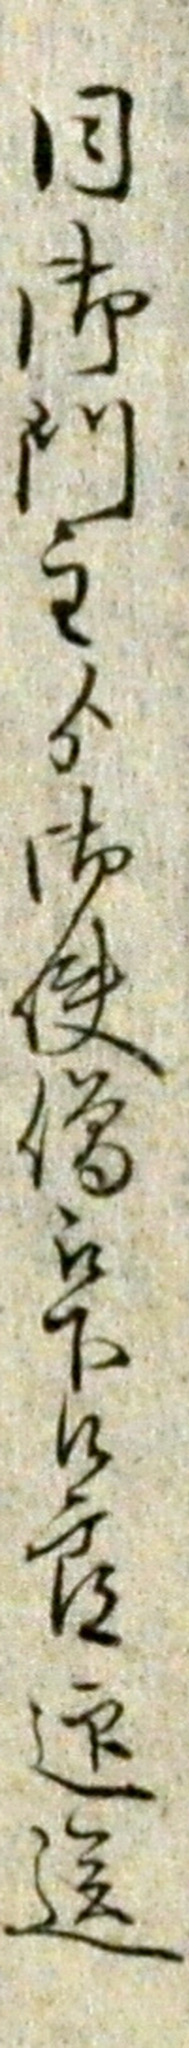同御門主ゟ御使僧被下候節迎送
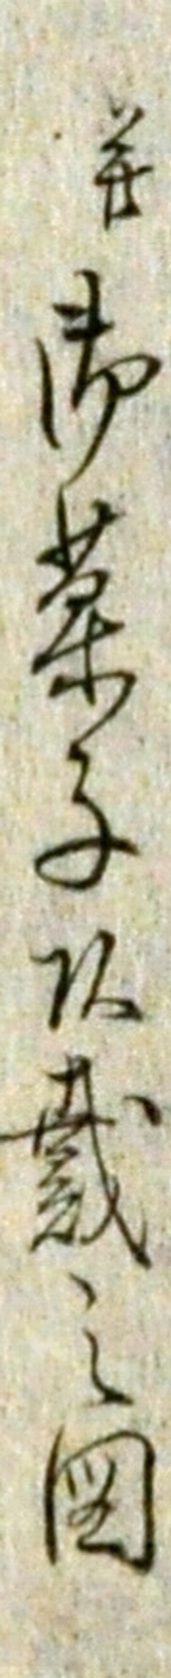幷御菓子頂戴之図

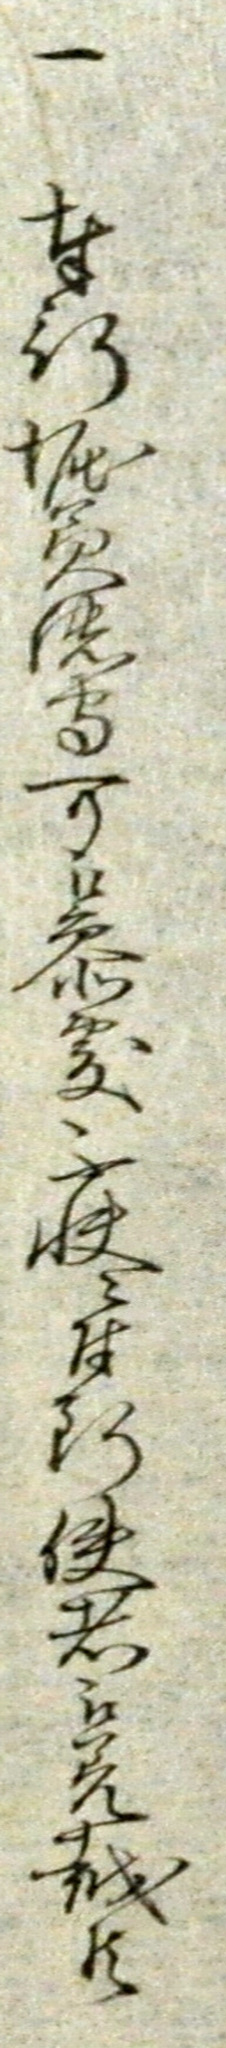一奉行堀美濃守可被参處不快ニ付断使者被差越候
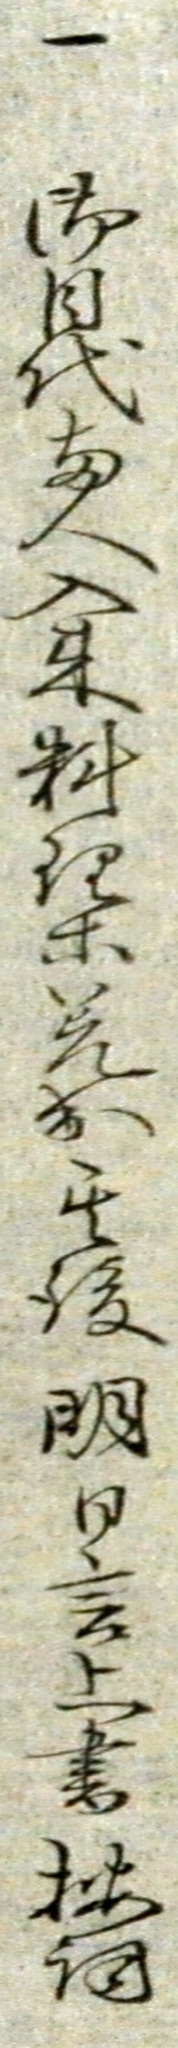一御目代両人入来料理等差出其後明日言上書按詞
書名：日光御名代相勤候節ノ留
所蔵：伊那市立高遠町図書館・合同会社AMANE
